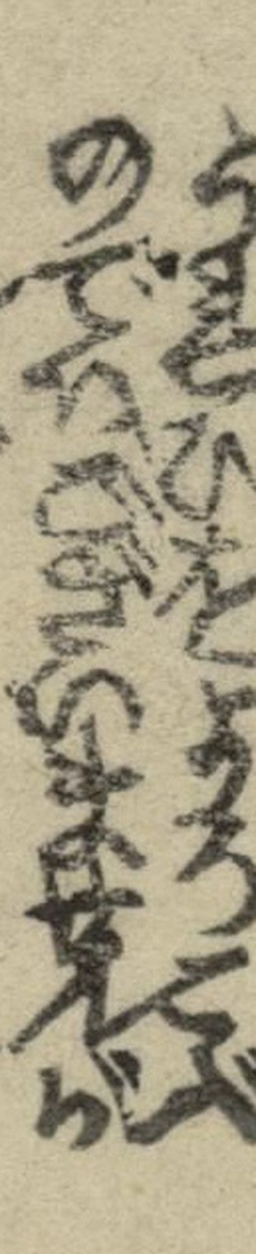のではございませんが
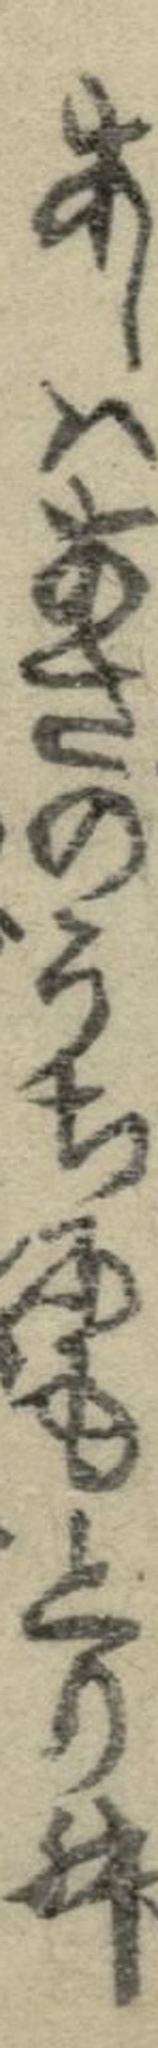あしはあさのうちにもとり枡
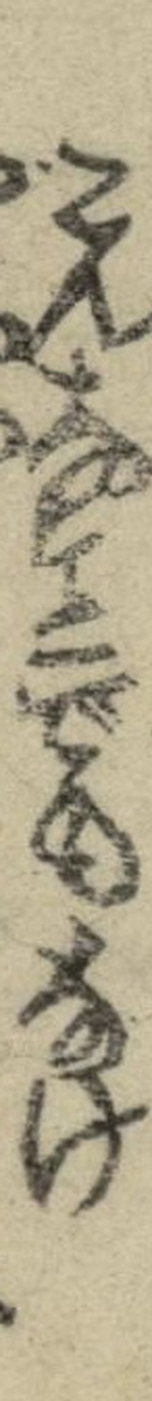こんなことでもなけ
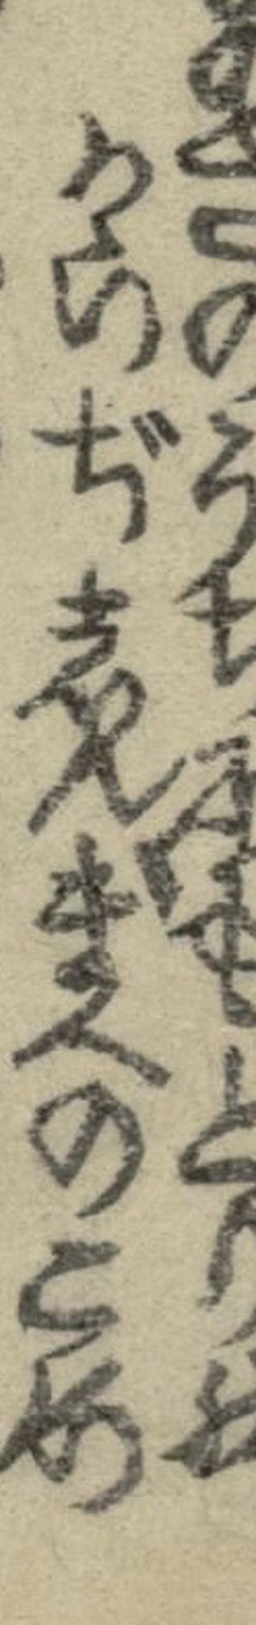からぢしんまへのこめ
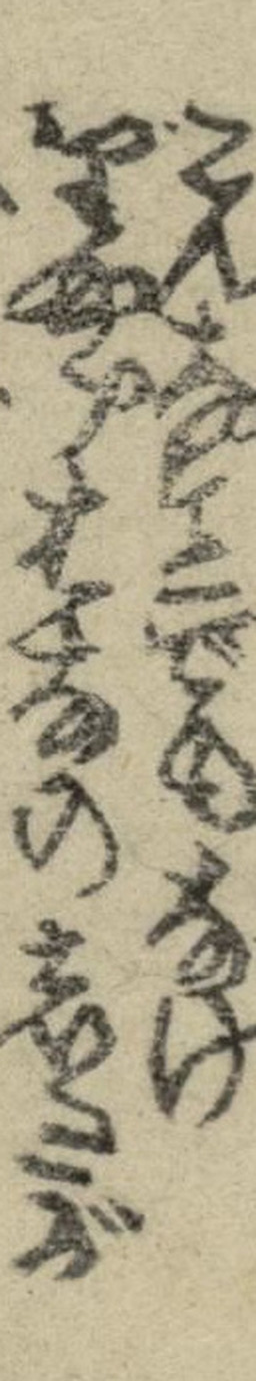りやアはなのしたが
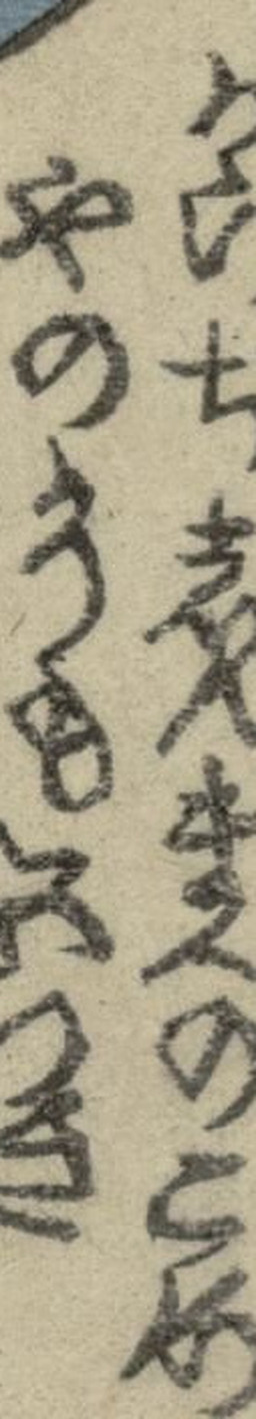やのかりも五つき
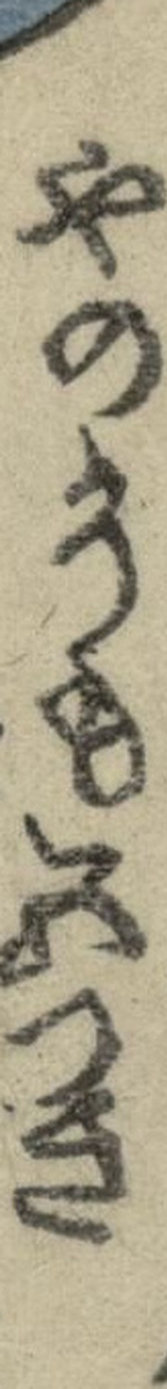やのかりも五つき
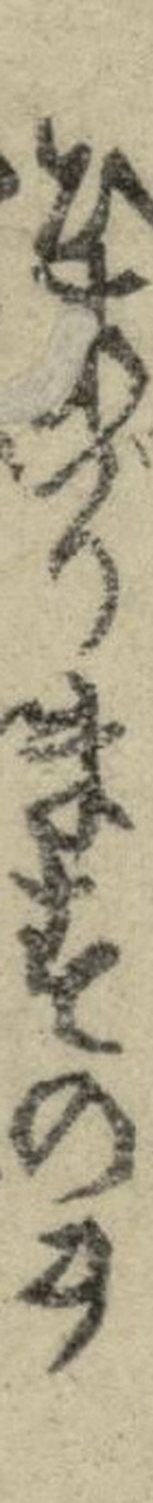ひあがりますのヲ
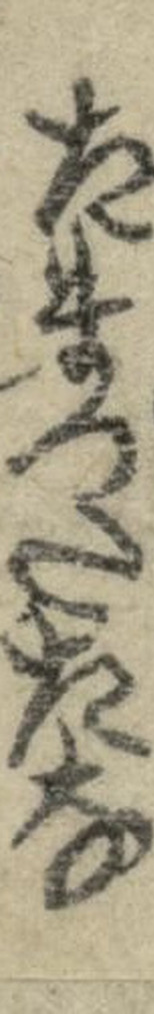たまつたたな
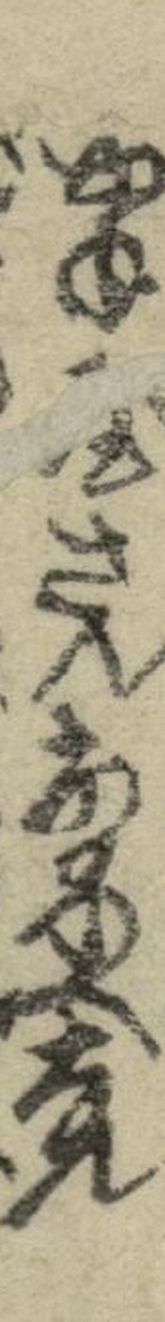やね屋さんおねへなん
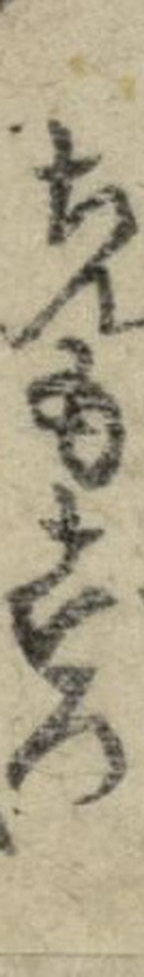ちんもすつ
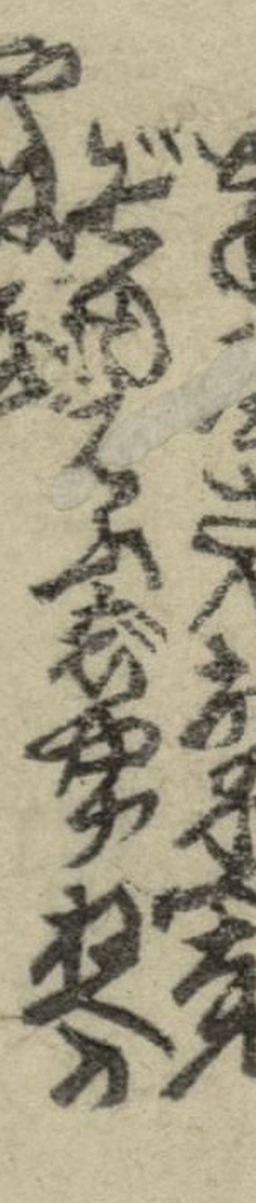ぞにはふじやアねへか
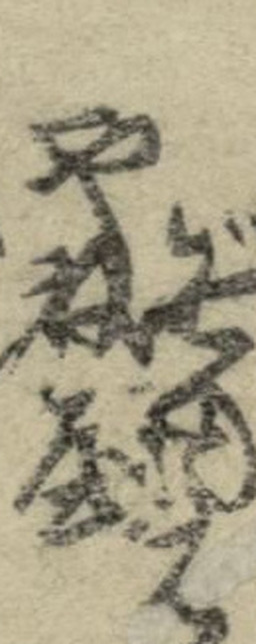やね屋
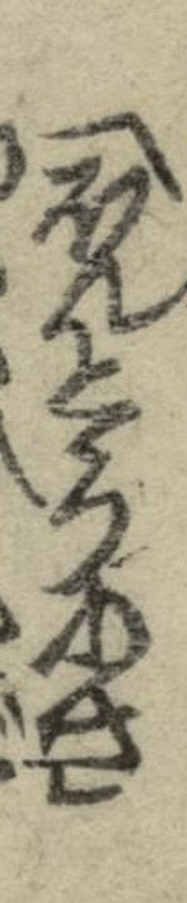〽ほんとうにさ
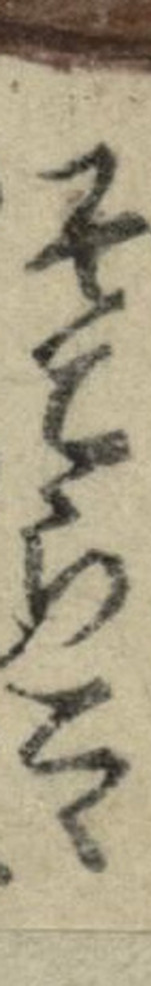そこらこゝ
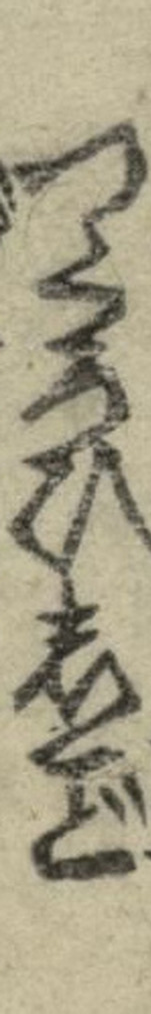つくろひしごと
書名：生捕ました三度の大地震
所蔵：東京大学地震研究所図書室 Earthquake Research Institute Library, The University of Tokyo, JAPAN
